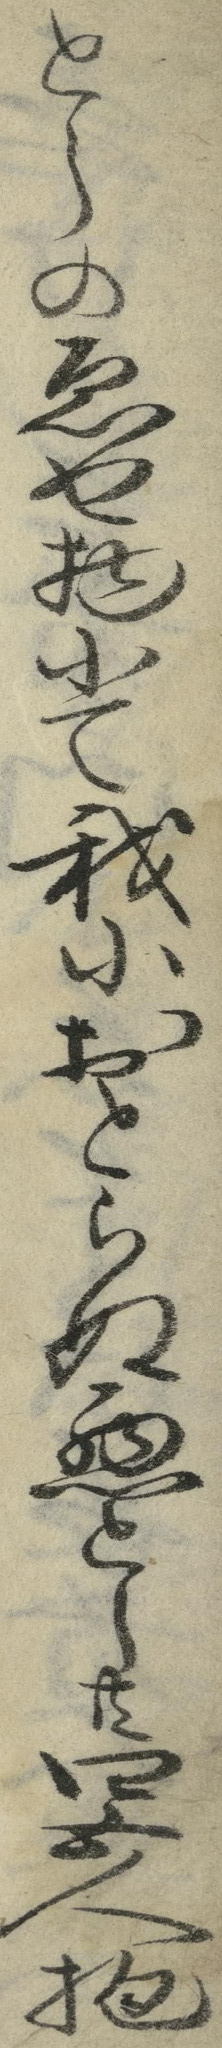とうのゑせ物にて我におとらぬ悪とう共四五人抱
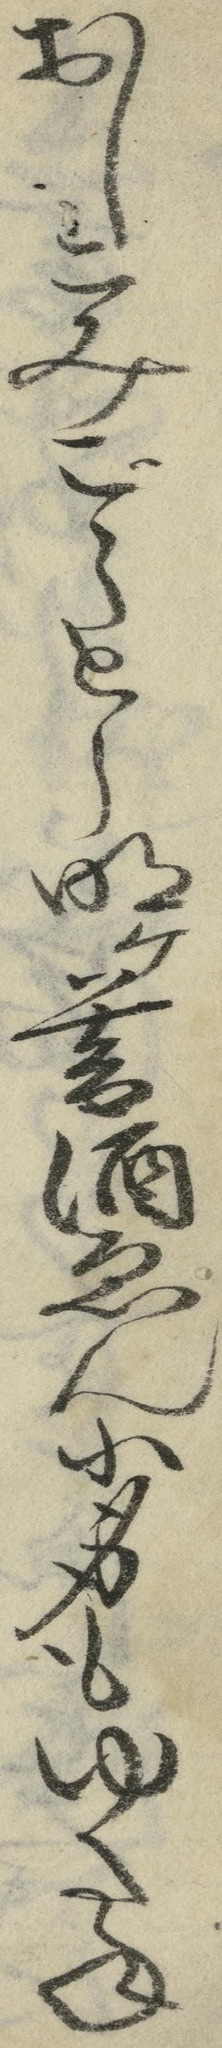おしこみごうとう明ケ暮酒ゑんに身もゆたね
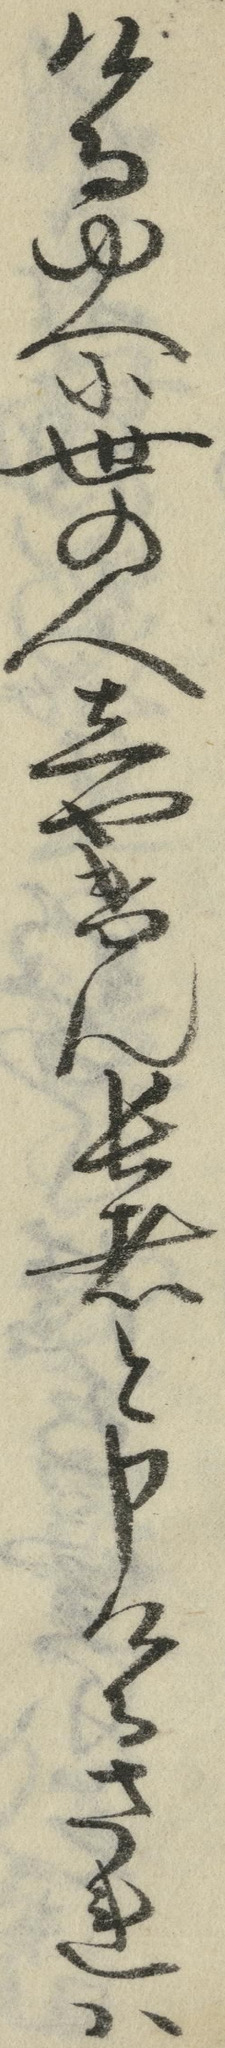けるゆへに世の人しやけん長者と申けるされハ
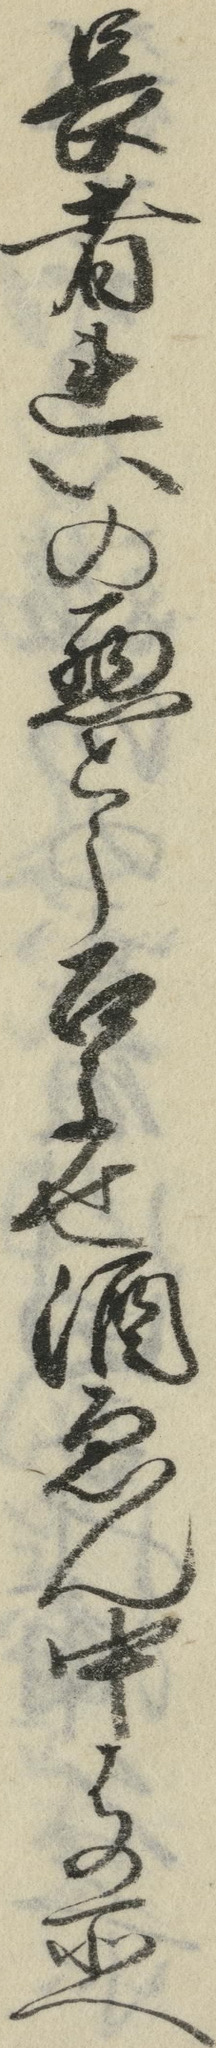長者れいの悪とう召よせ酒ゑん中はの所へ
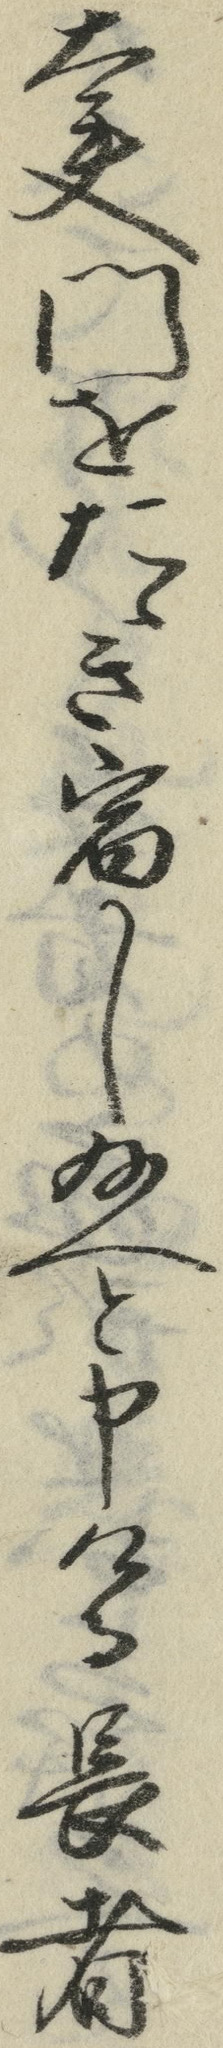太夫門をたゝき宿かし給へと申ける長者
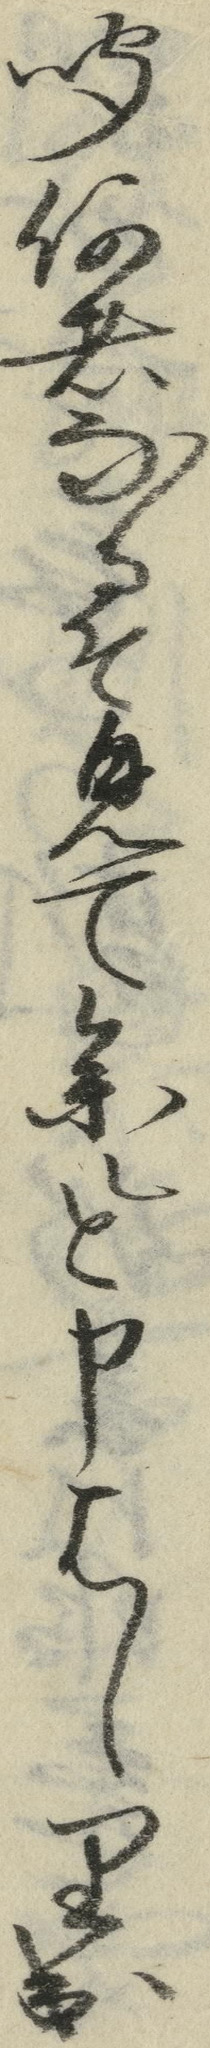聞何者なるそ見て参レと申はしり出
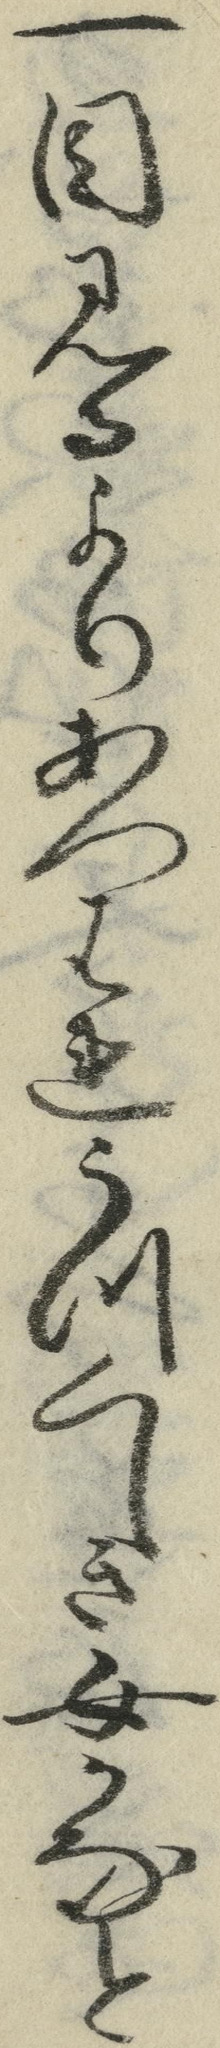一目見るよりあつはれうつくしき女かなと
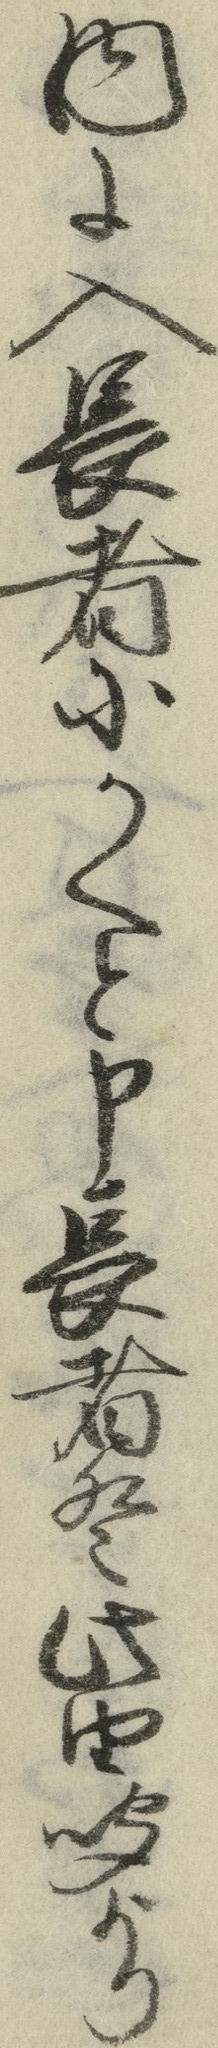内に入長者にかくと申長者は此由聞より
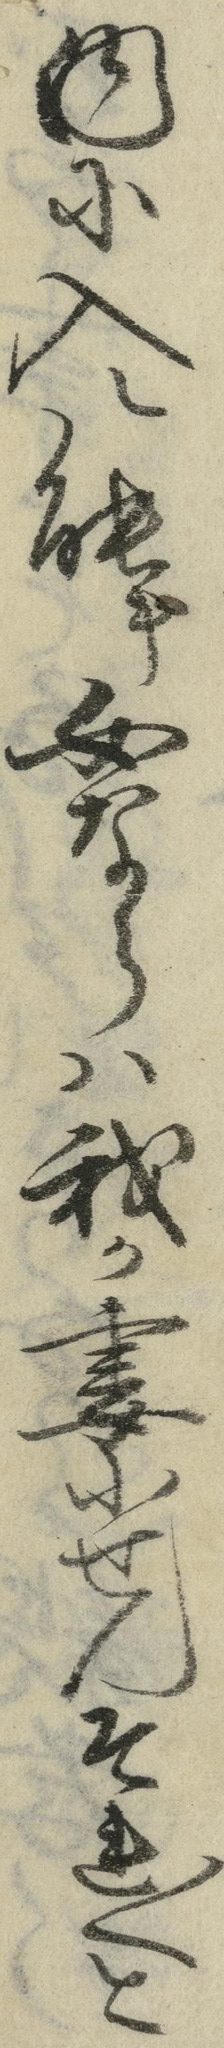内に入レ能キ女ならハ我か妻にせんそれ〳〵と
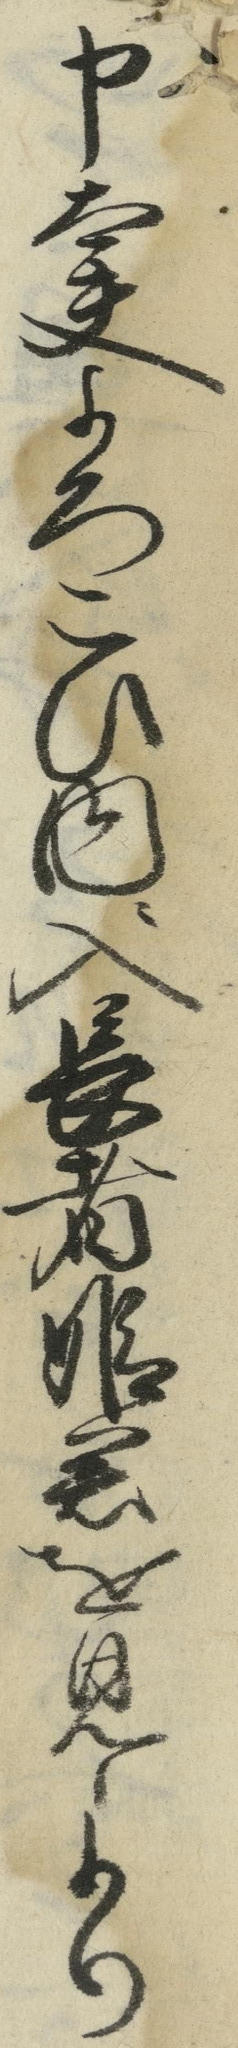申太夫よろこひ内ニ入長者姫君を見より
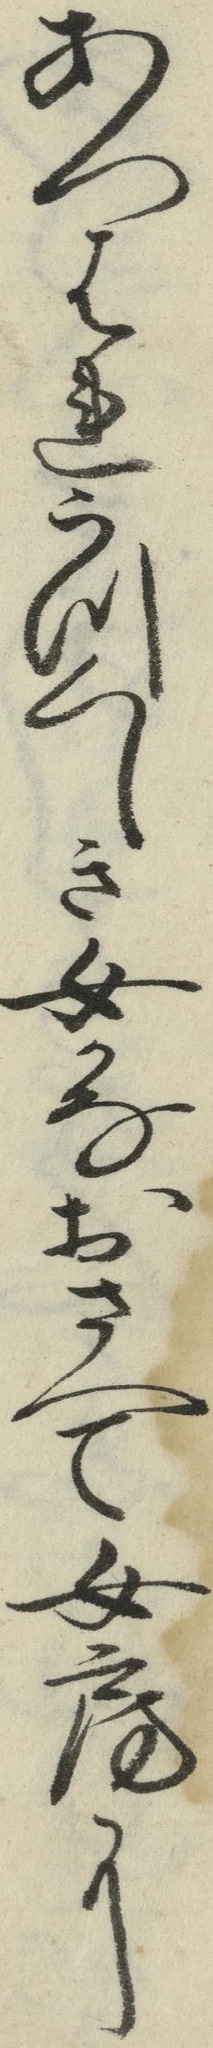あつはれうつくしき女かなおさへて女房に
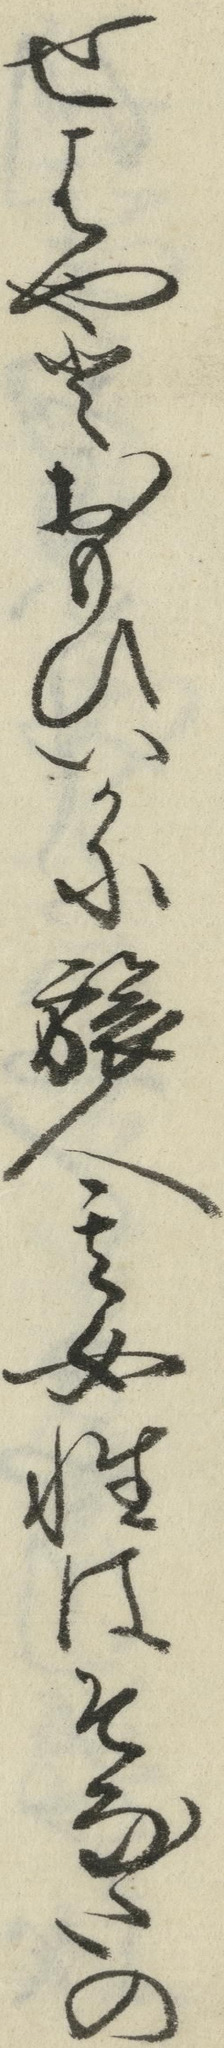せはやとおもひいかに旅人其女性はそなたの
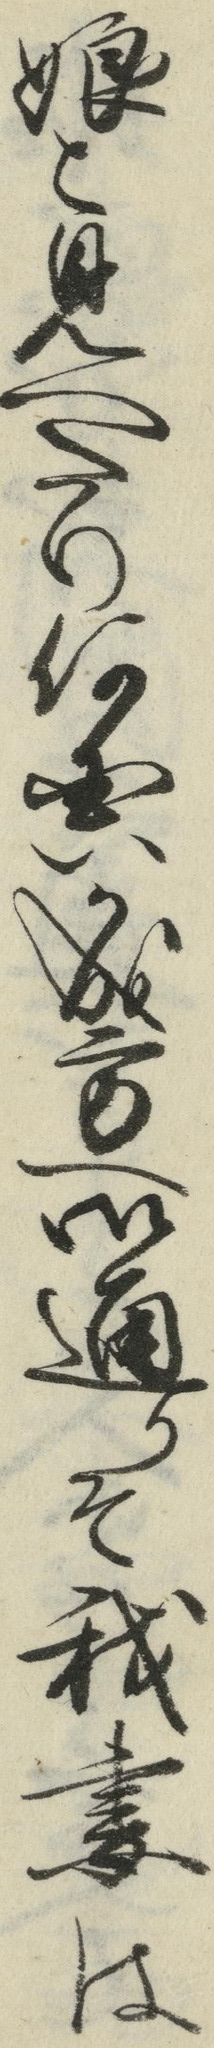娘と見へたり何国いか成方へ御通りそ我妻は
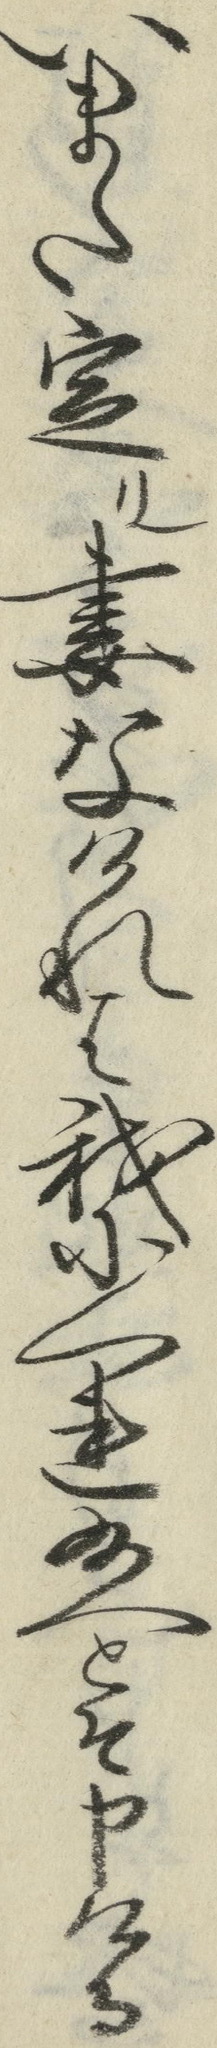いまた定ル妻なけれは我にくれ給へとそ申ける
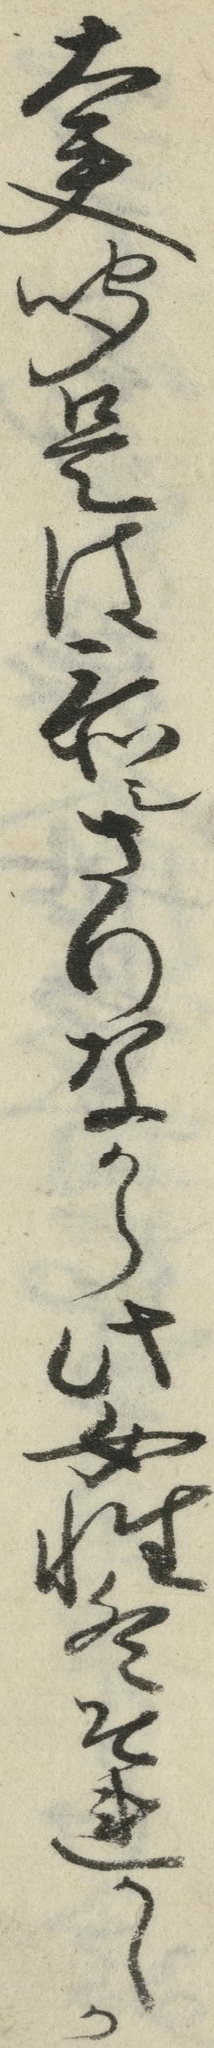太夫聞是は忝シさりなから此女性はそれかしか
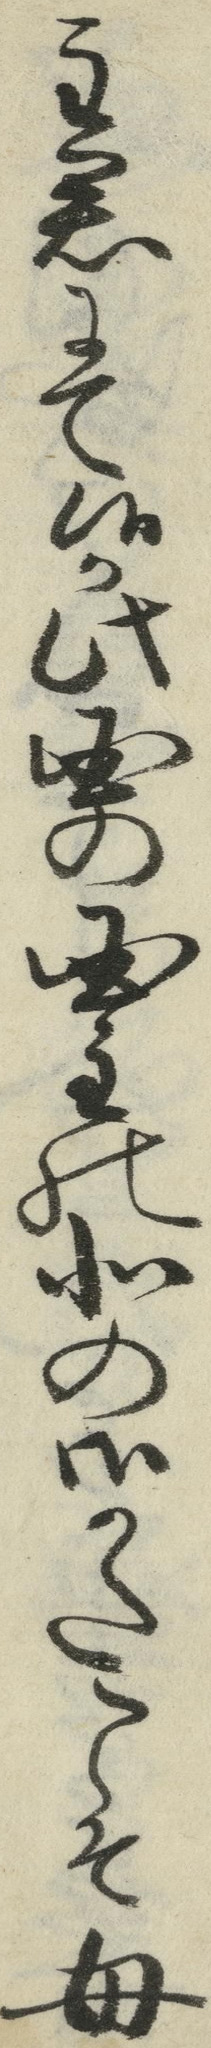主君にて候か此国の国主の北の御かたこそ母
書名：浅間記
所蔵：東京大学地震研究所図書室 Earthquake Research Institute Library, The University of Tokyo, JAPAN
